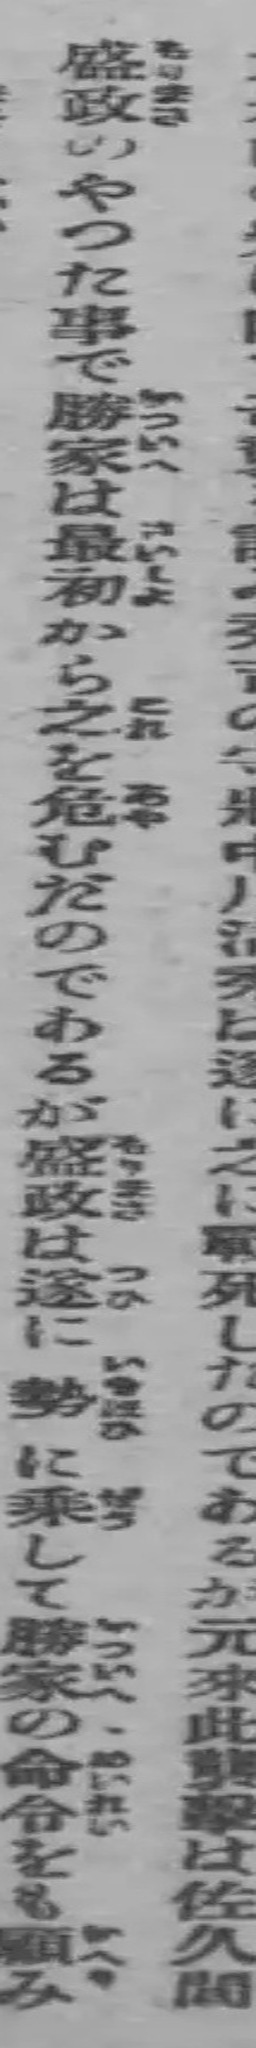賤ケ岳盛政のやつた事で勝家は最初から之を危むだのであるが盛政は遂に勢に乗して勝家の命令をも顧み
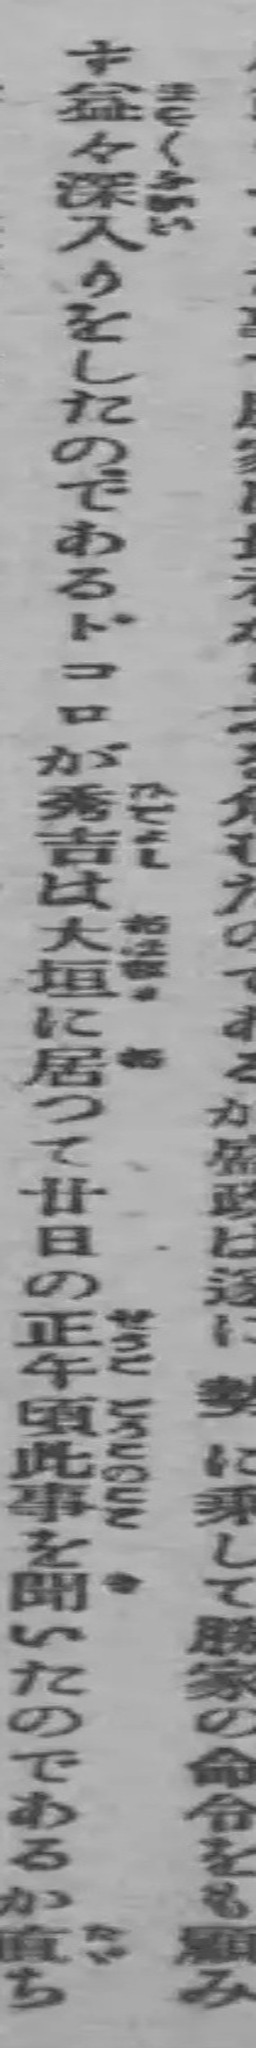ず益々深入りをしたのであるトコロが秀吉は大垣に居つて廿日の正午頃此事を聞いたのであるか直ち
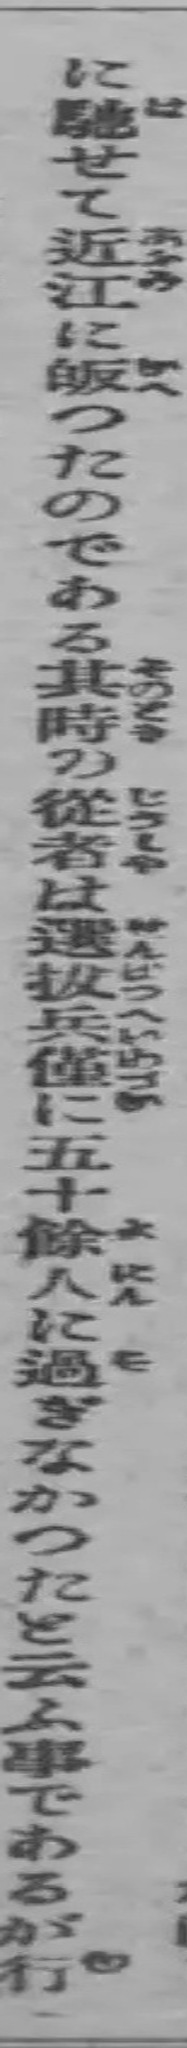に馳せて近江に皈つたのである其時の従者は選抜兵僅に五十余人に過ぎなかつたと云ふ事であるが行
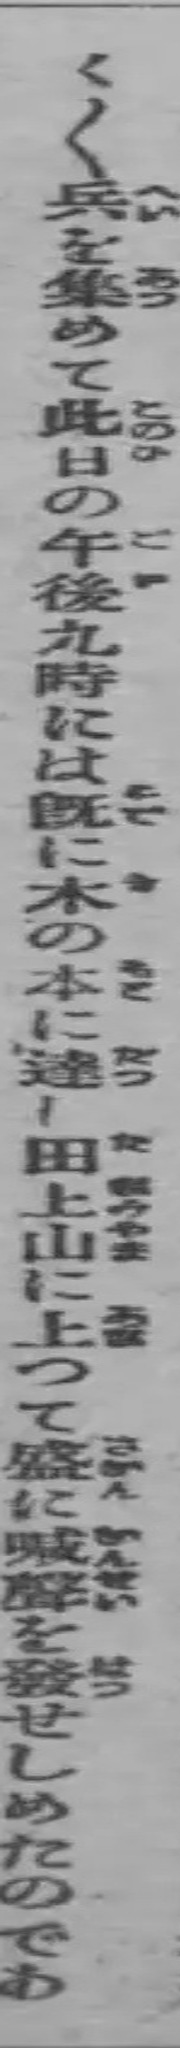く〳〵兵を集めて此日の午後九時には既に木の本に達し田上山に上つて盛に喊声を発せしめたのであ
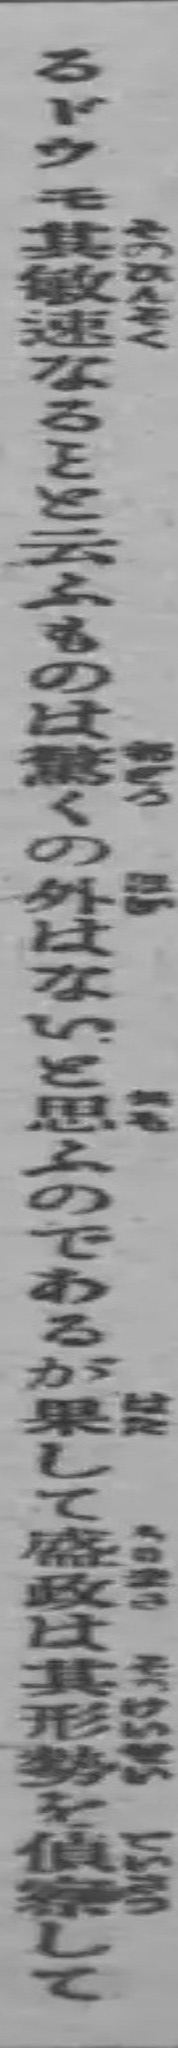るドウモ其敏速なることと云ふものは驚くの外はないと思ふのであるが果して盛政は其形勢を偵察して
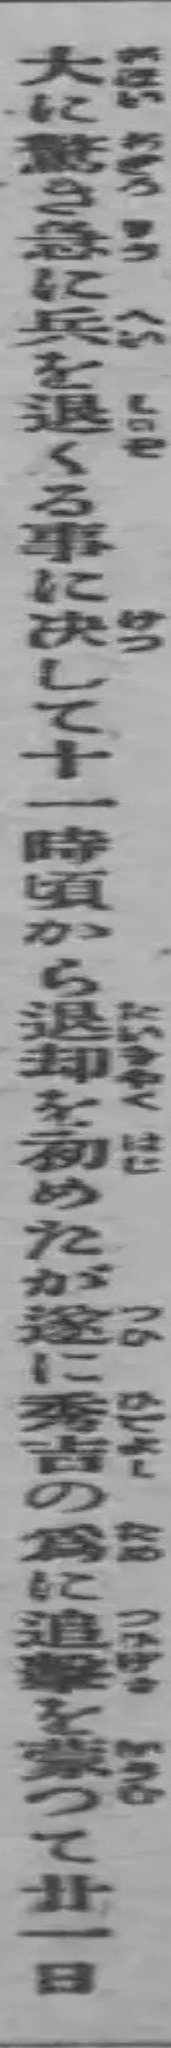大に驚き急に兵を退くる事に決して十一時頃から退却を初めたが遂に秀吉の為に追撃を蒙つて廿一日
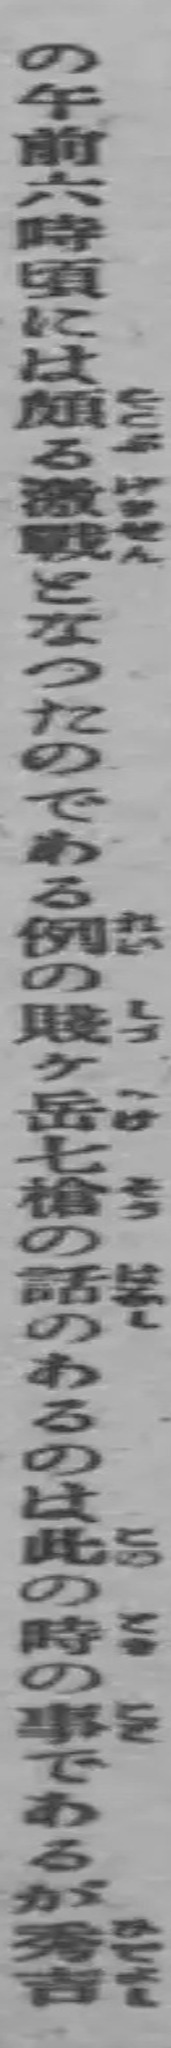の午前六時頃には頗る激戦となつたのである例の賤ケ岳七槍の話のあるのは此時の事であるが秀吉
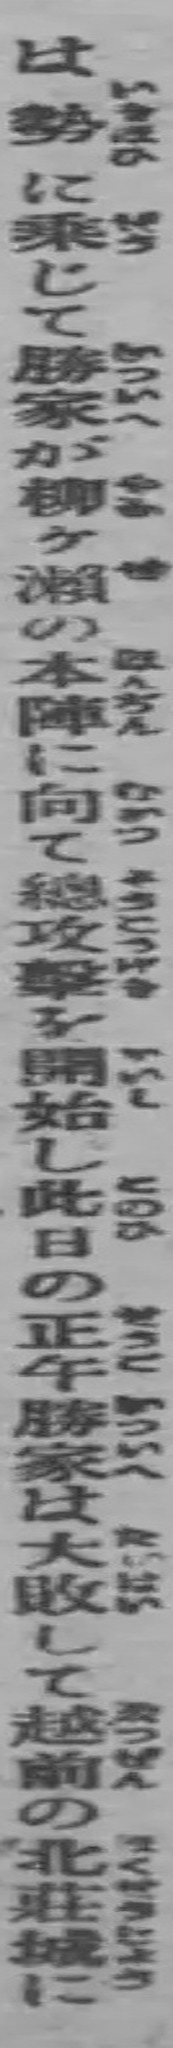勝家亡ぶは勢に乗じて勝家が柳ケ瀬の本陣に向て総攻撃を開始し此日の正午勝家は大敗して越前の北荘城に
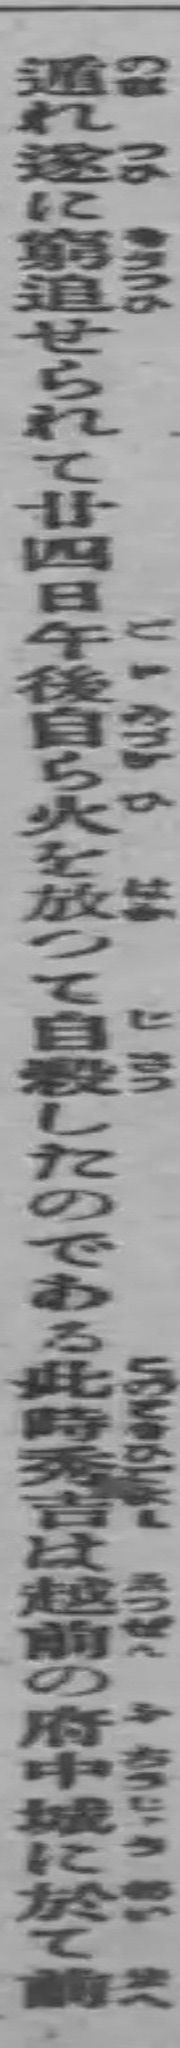遁れ遂に窮追せられて廿四日午後自ら火を放つて自殺したのである此時秀吉は越前の府中城に於て前
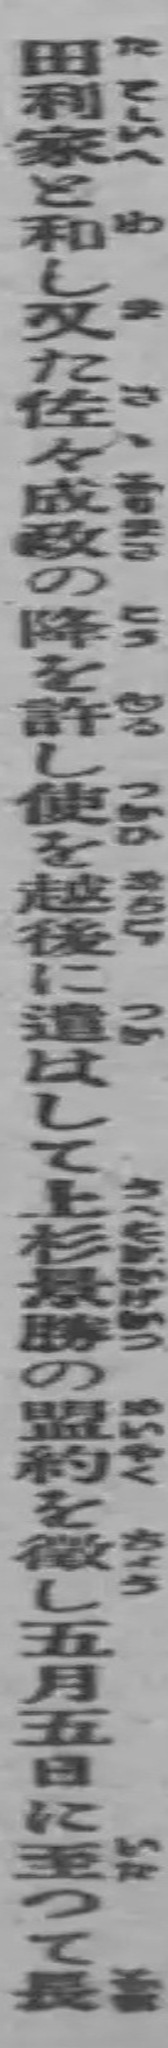田利家と和し又た佐々成政の降を許し使を越後に遣はして上杉景勝の盟約を徴し五月五日に至つて長
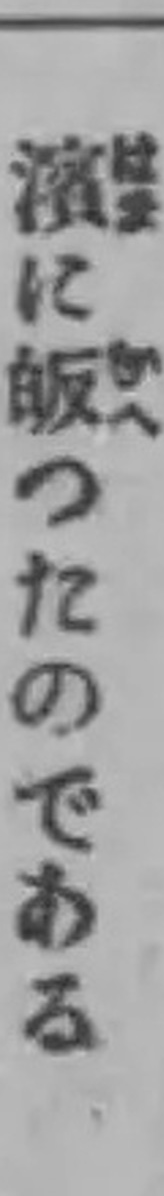浜に皈つたのである
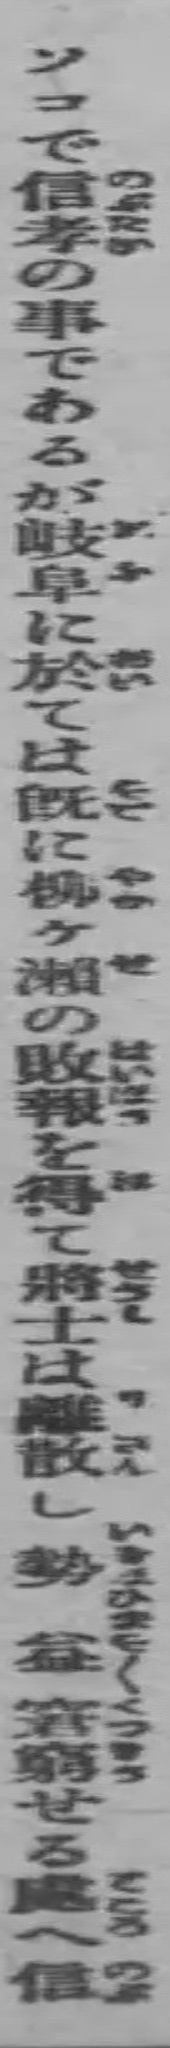ソコで信孝の事であるが岐阜に於ては既に柳ケ瀬の敗報を得て将士は離散し勢益窘窮せる処へ信
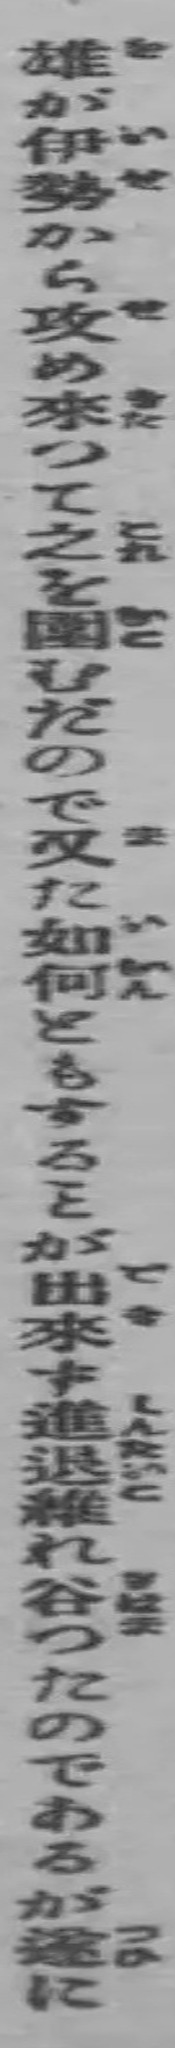雄が伊勢から攻め来つて之を囲むだので又た如何ともすることが出来ず進退維れ谷つたのであるが遂に
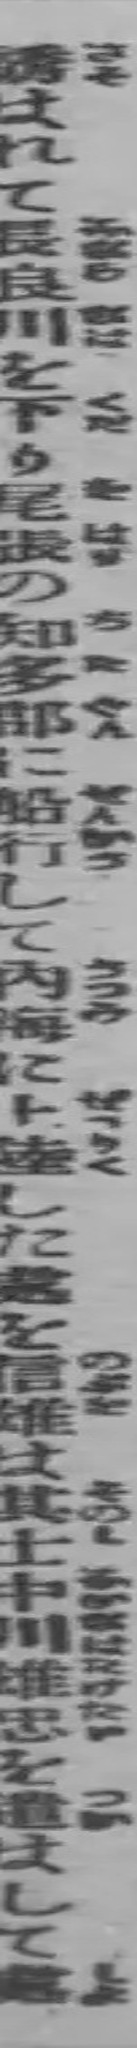信孝自殺誘はれて長良川を下り尾張の知多郡に船行して内海に上陸した処を信雄は其士中川雄忠を遣はして処
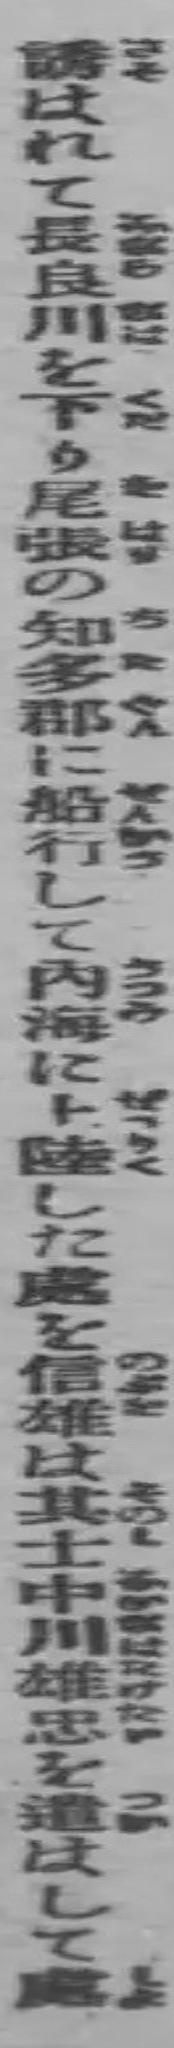信孝自殺誘はれて長良川を下り尾張の知多郡に船行して内海に上陸した処を信雄は其士中川雄忠を遣はして処
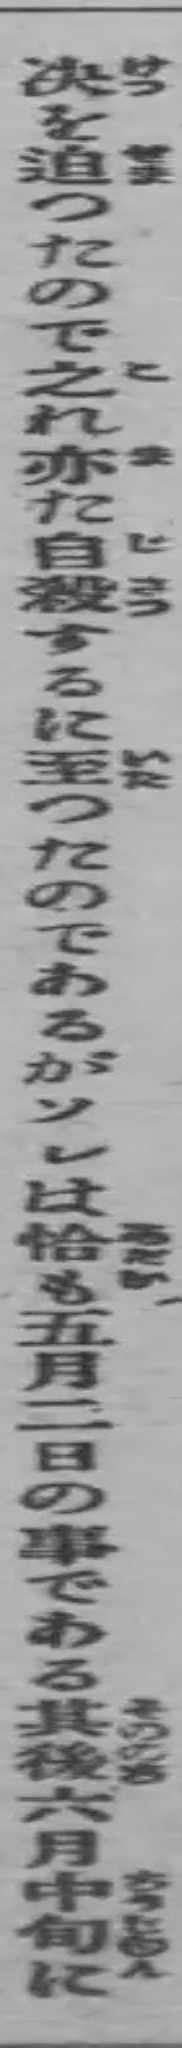決を迫つたので之れ亦た自殺するに至つたのであるがソレは恰も五月二日の事である其後六月中旬に
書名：豊橋市史談
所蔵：国立国会図書館 National Diet Library, JAPAN
